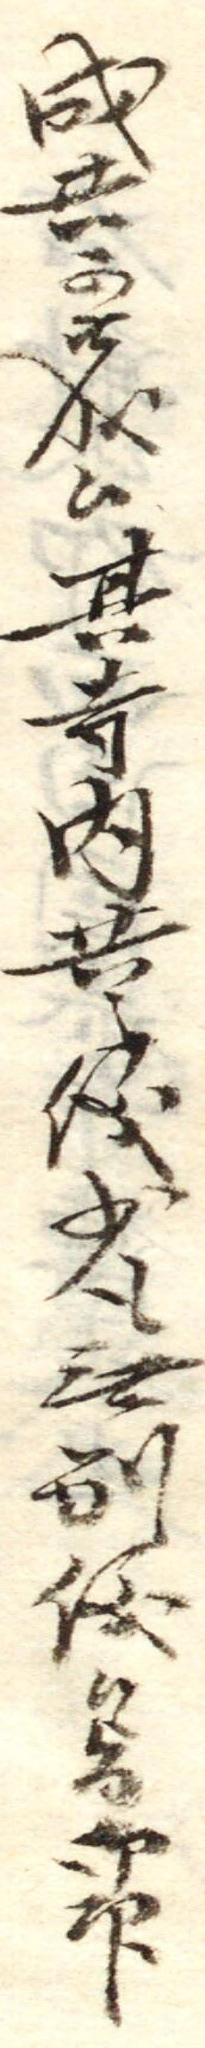成共可被成候其寺内共之儀少も無別儀候旨御印
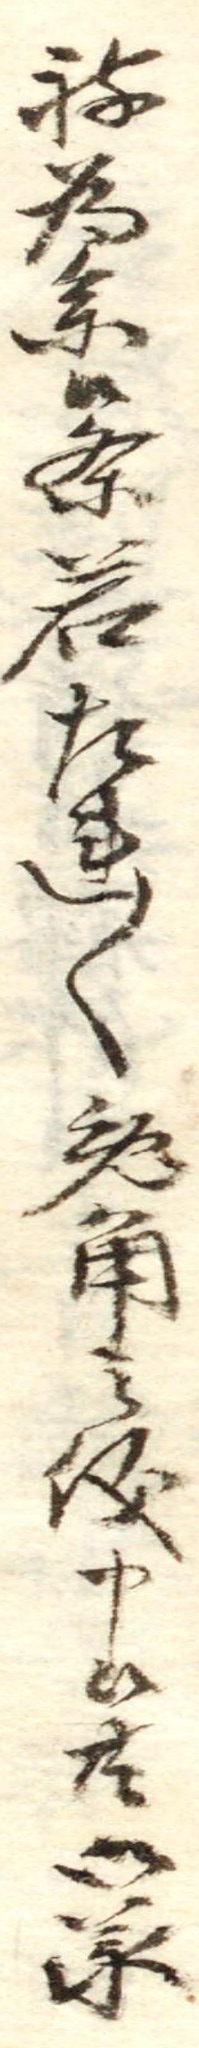被為参候条若左連〳〵兎角之儀申候共御承
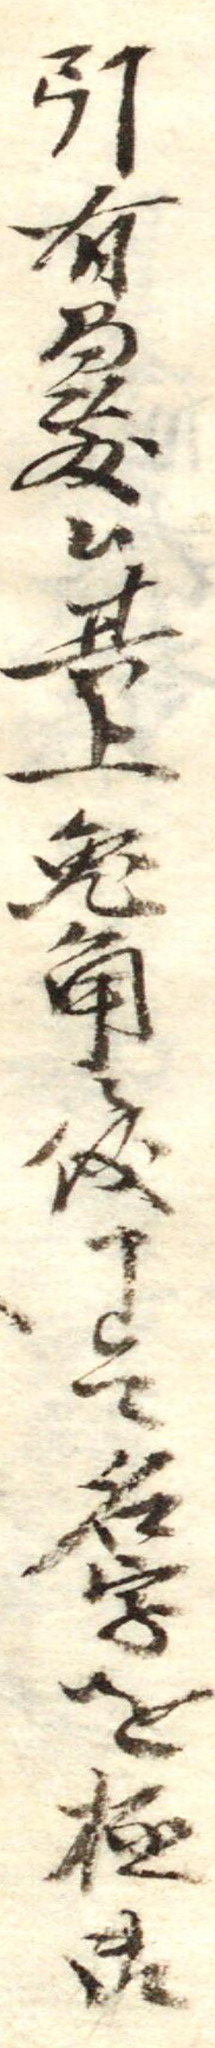引有間敷候其上兎角之儀申候て名字を極御
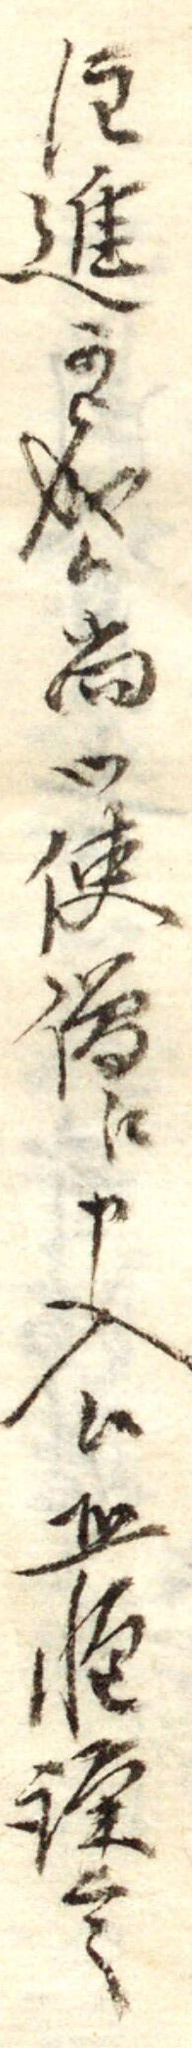注進可被成候尚御使僧江申入候恐惶謹言

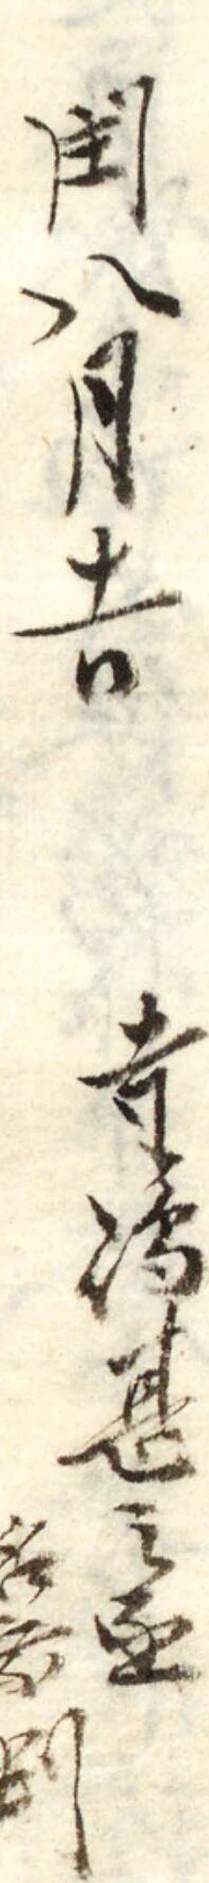閏八月十一日寺島甚之丞
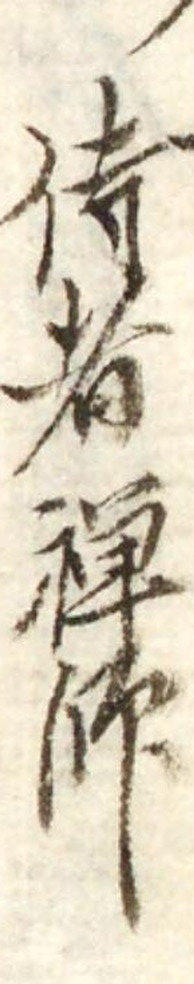侍者禅師
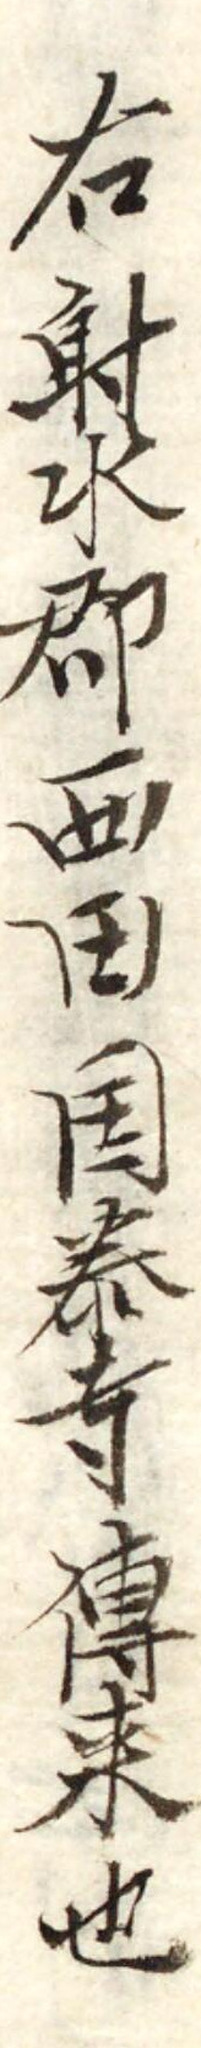右射水郡西田国泰寺伝来也
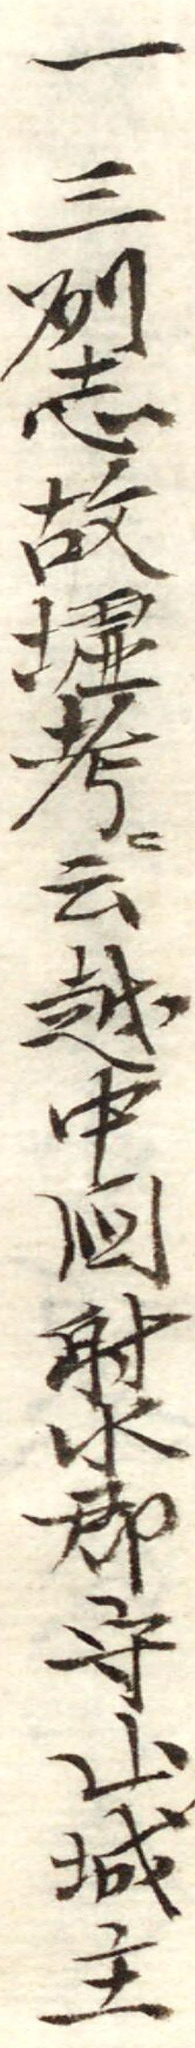一三州志故墟考に云越中国射水郡守山の城主
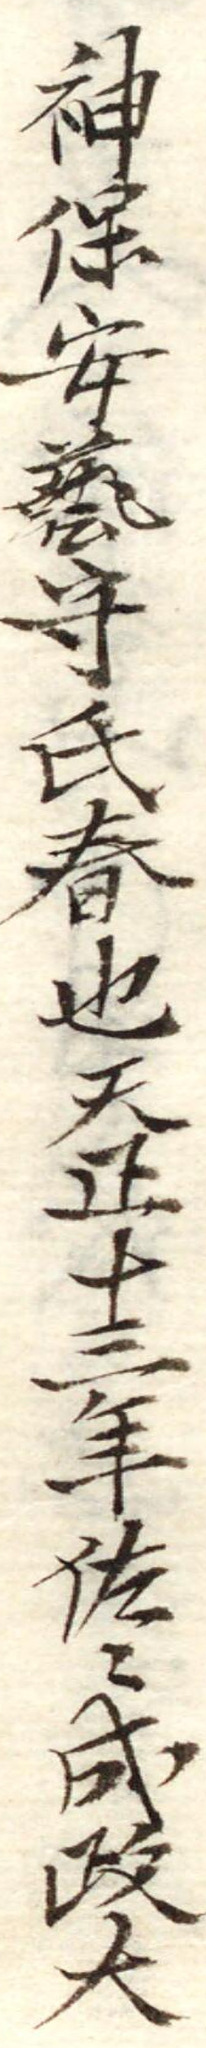神保安芸守氏春也天正十三年佐々成政大
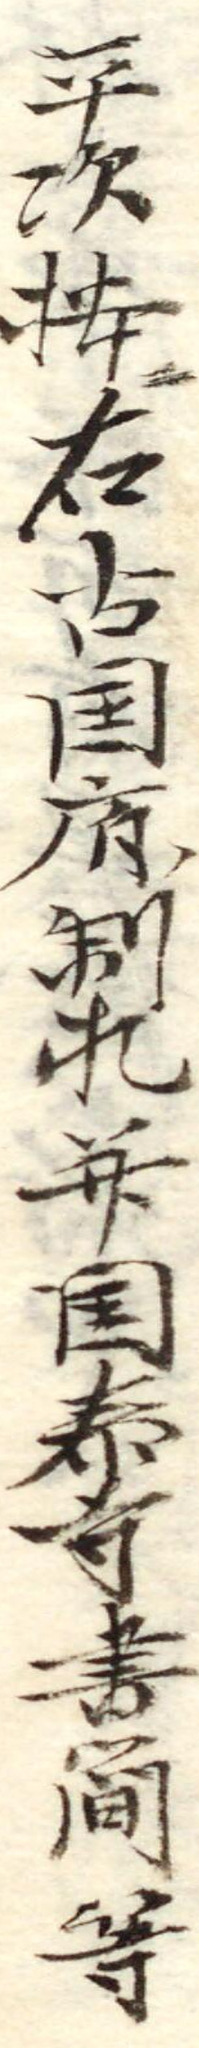平次按に右古国府の制札幷国泰寺書簡等
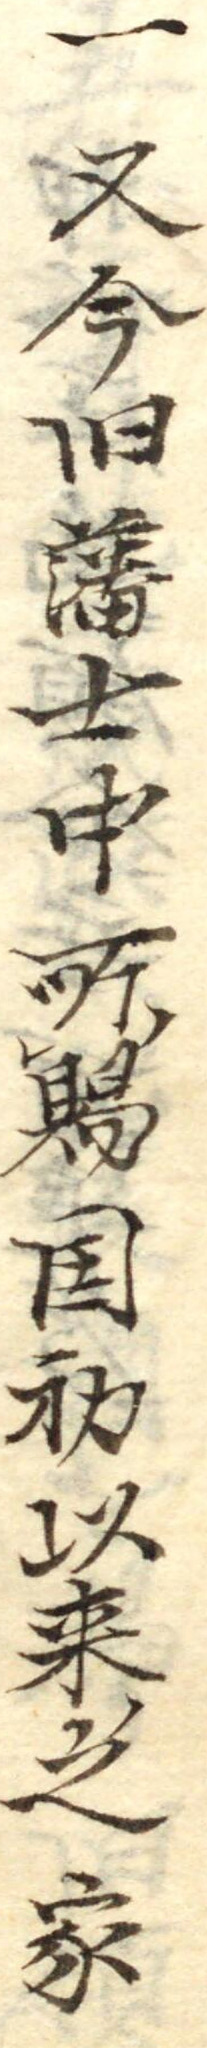一又今旧藩士中所の賜国初以来之家
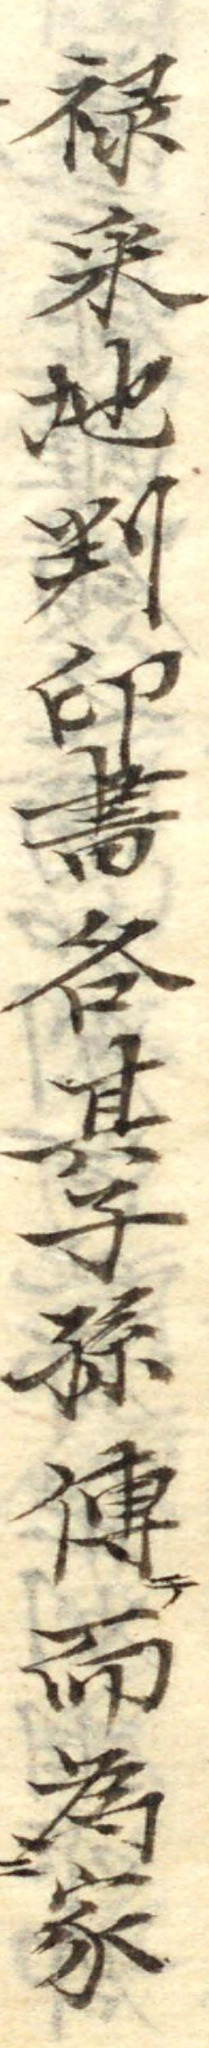禄釆地判印書各其子孫伝而為家
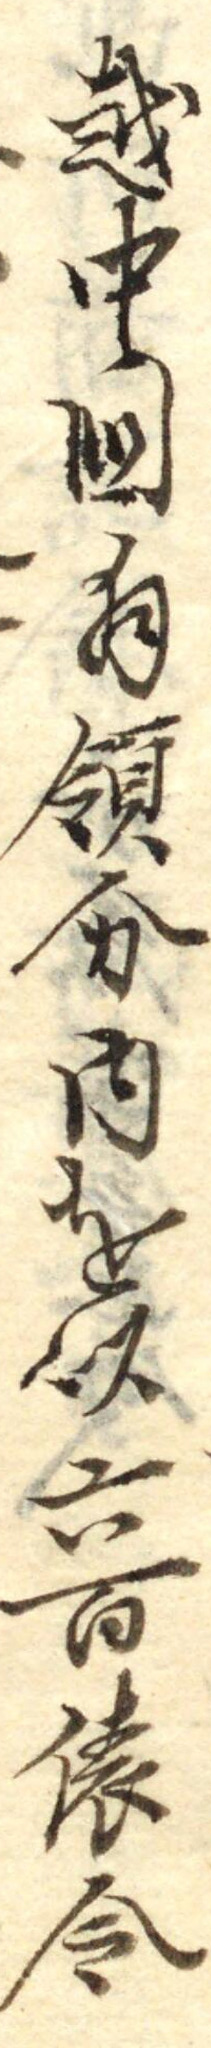越中国拝領分内を以六百俵令
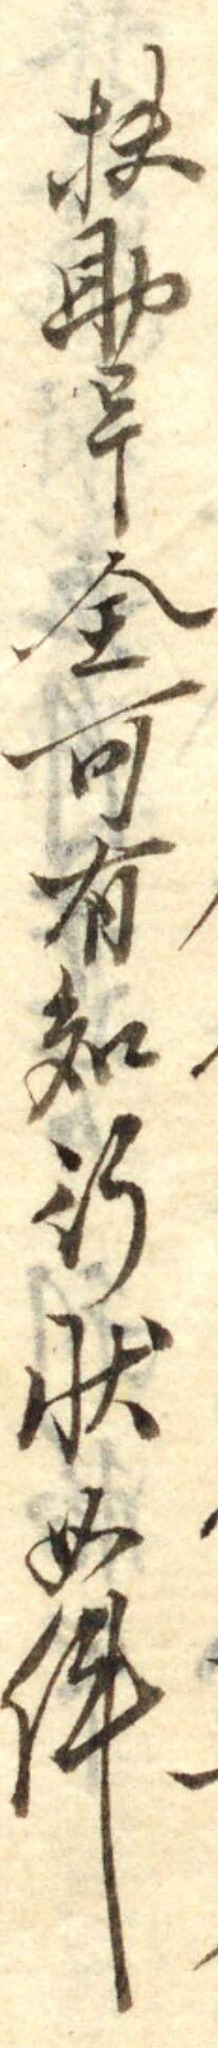扶助畢全可有知行状如件
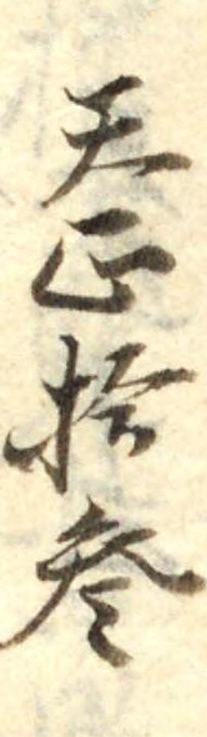天正拾参
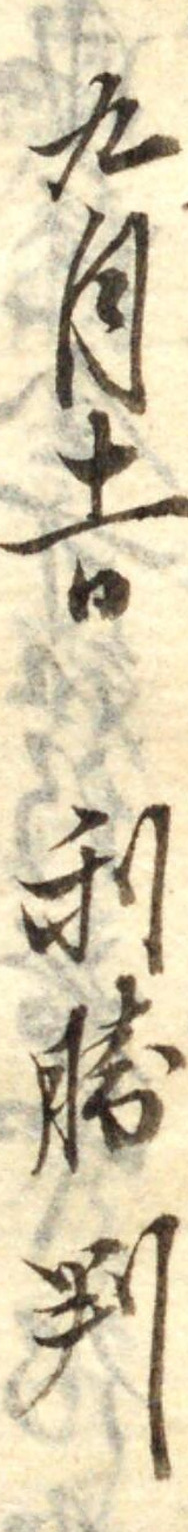九月十一日利勝判
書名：前田家封国証書集録
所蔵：Ishikawa Prefectural Library
